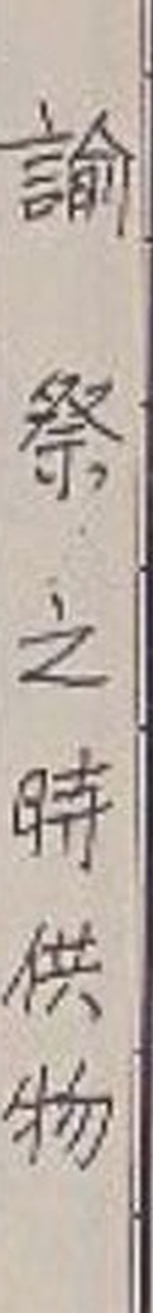諭祭之時供物
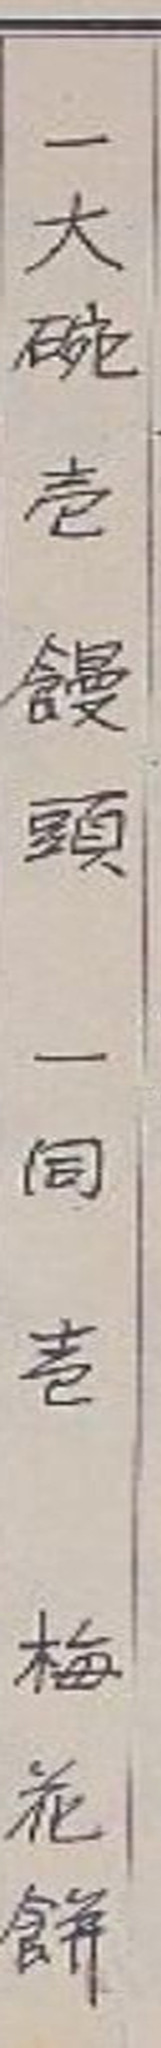一大碗壱饅頭一同壱梅花餅
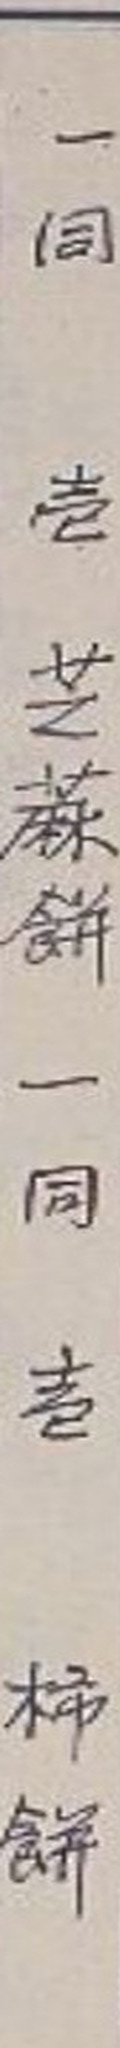一同壱芝蔴餅一同壱柿餅
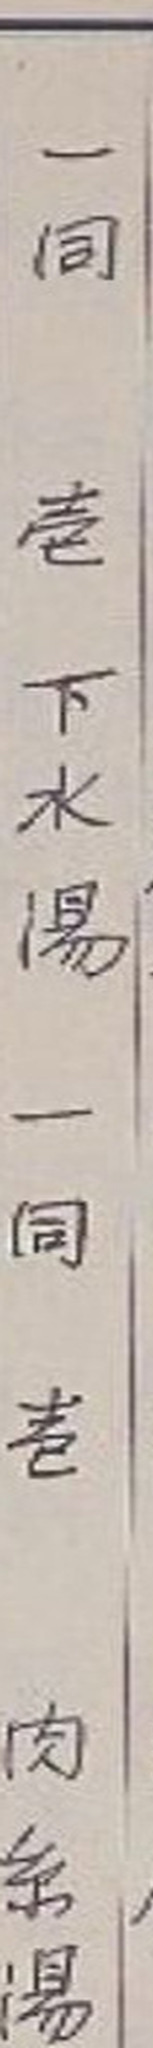一同壱下水湯一同壱肉糸湯
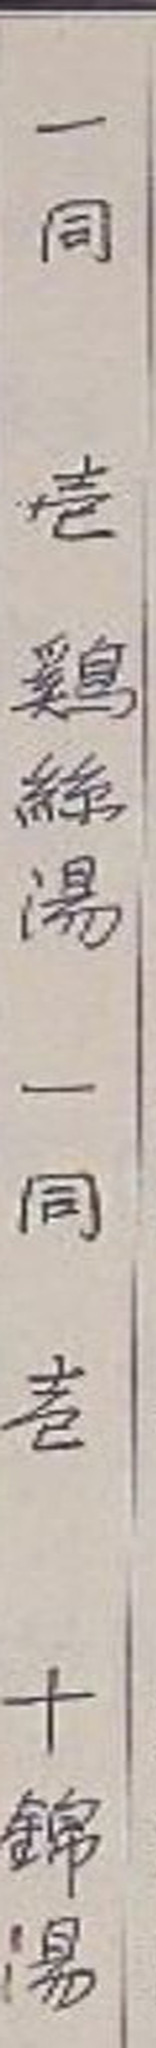一同壱鶏絲湯一同壱十錦湯
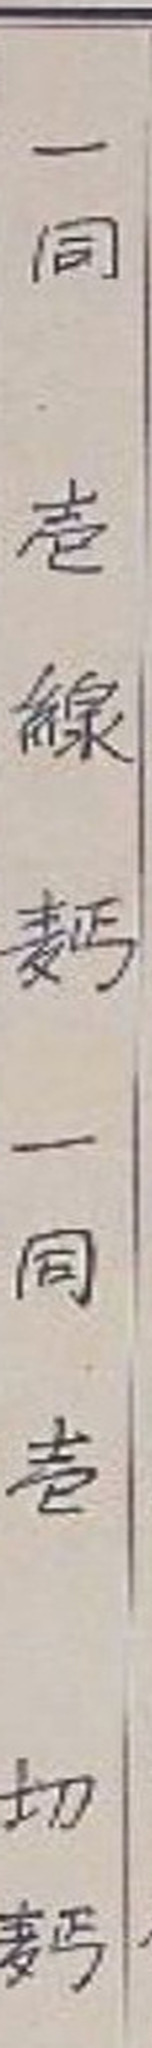一同壱線麪一同壱切麪
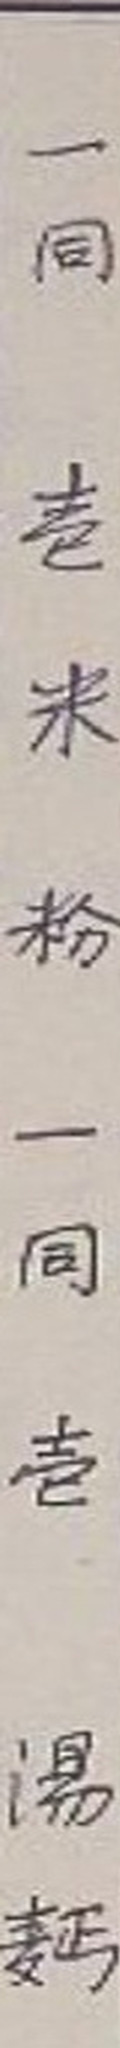一同壱米粉一同壱湯麪
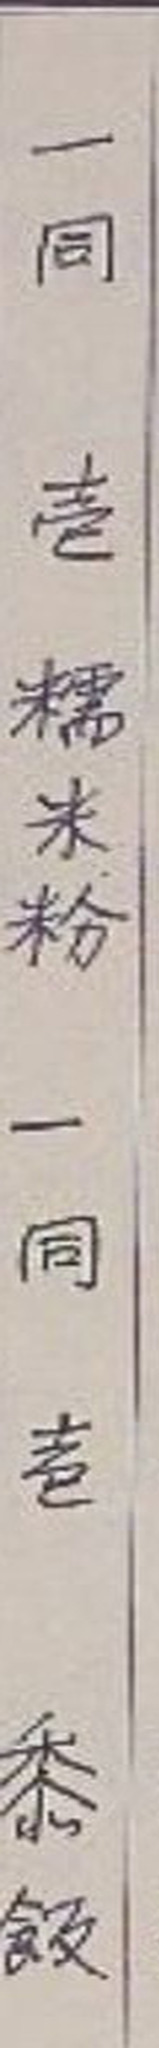一同壱糯米粉一同壱黍飯
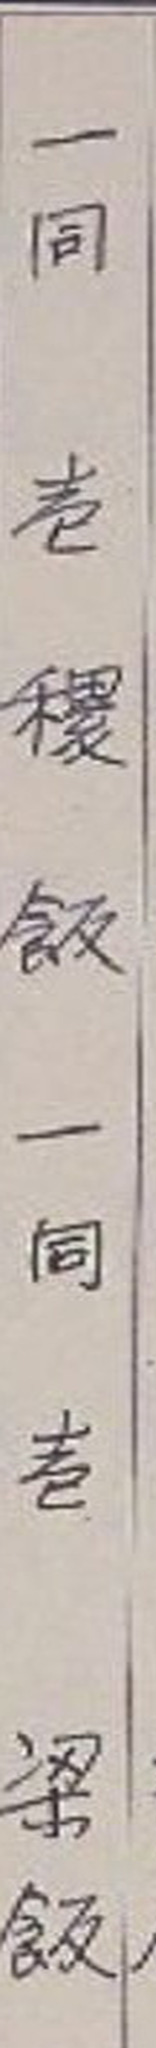一同壱稷飯一同壱粱飯
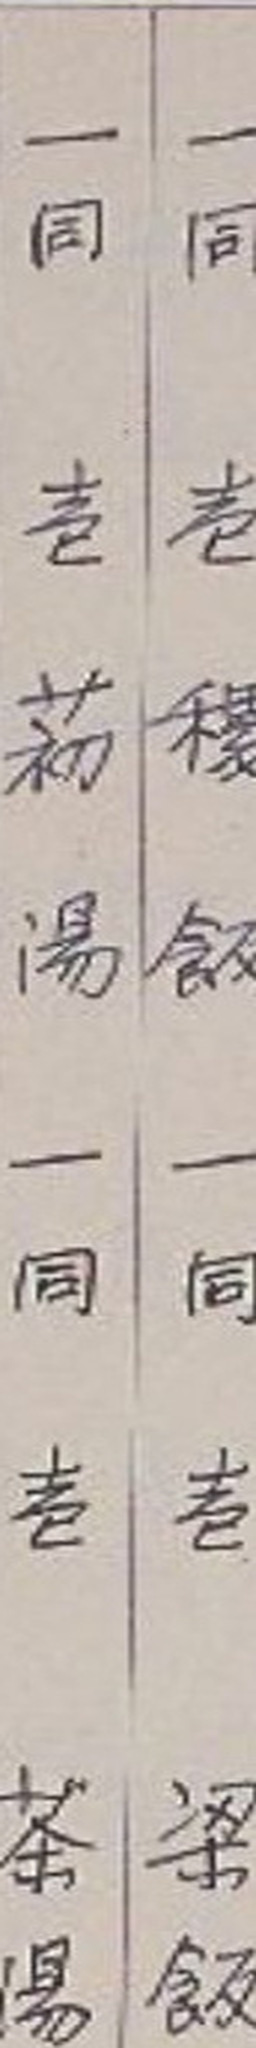一同壱湯一同壱茶湯
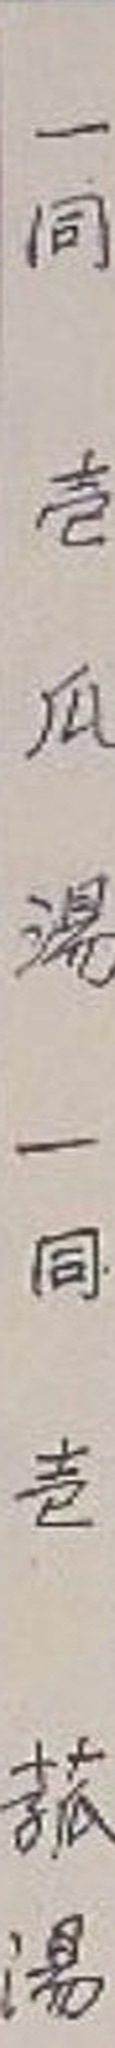一同壱瓜湯一同壱菰湯
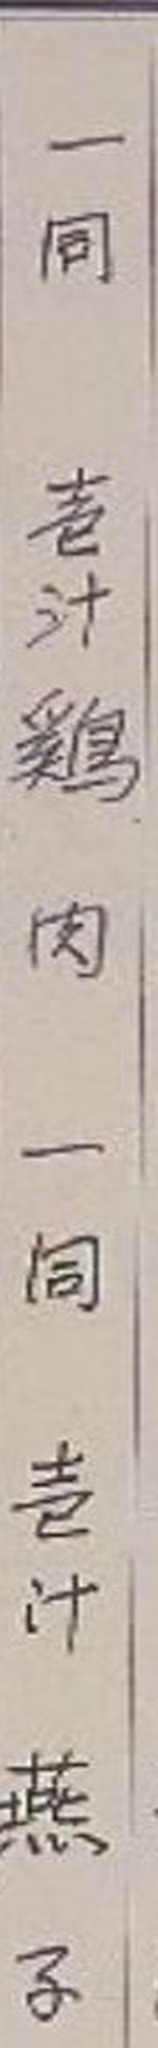一同壱汁鶏肉一同壱汁燕子
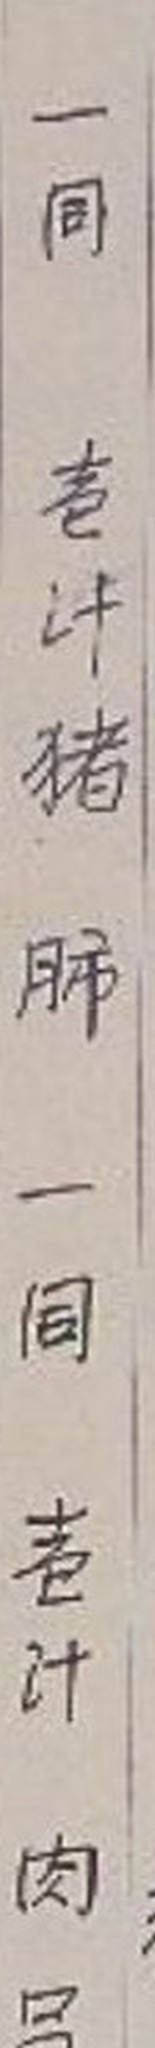一同壱汁猪肺一同壱汁肉員

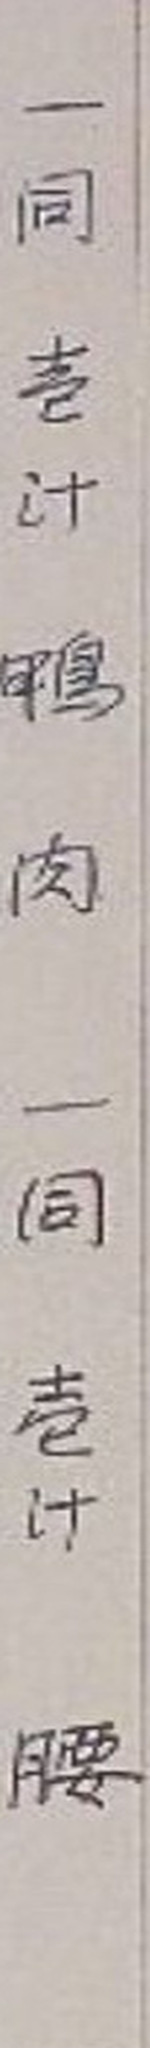一同壱汁鴨肉一同壱汁腰心
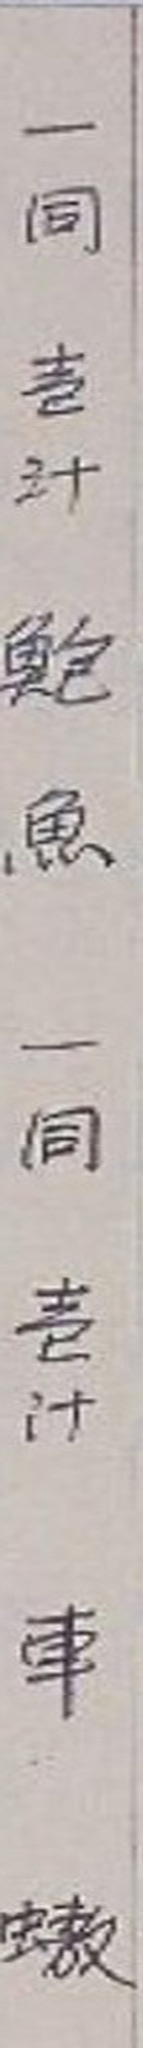一同壱汁鮑魚一同壱汁車𧑃
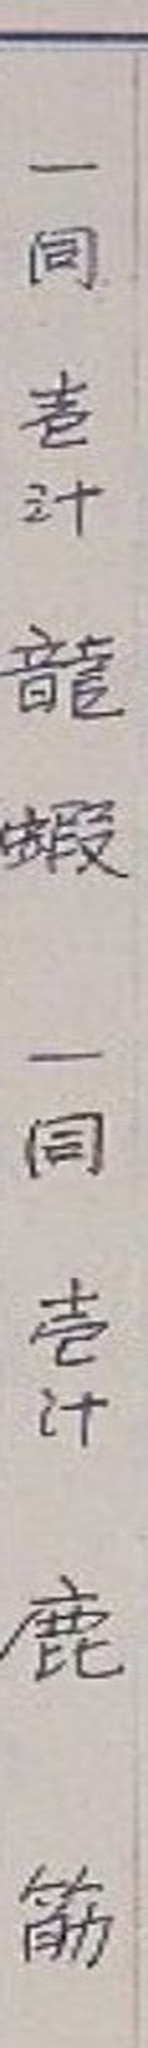一同壱汁龍鰕一同壱汁鹿筋
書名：支那冊封使来琉諸記 下巻
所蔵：University of the Ryukyus Library
